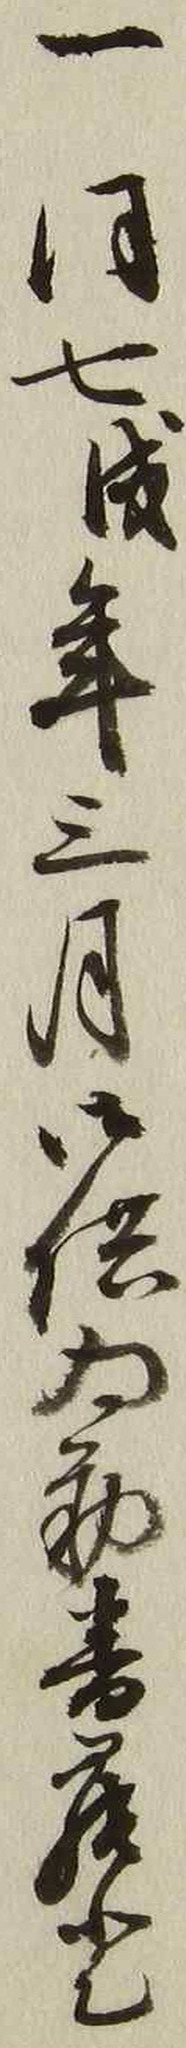一同七戌年三月御供為勤番罷登
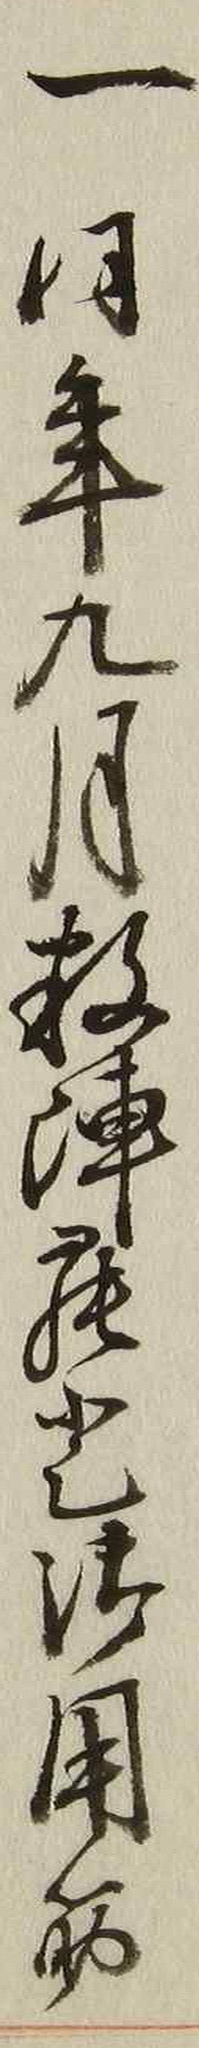一同年九月数陣被罷登御用筋
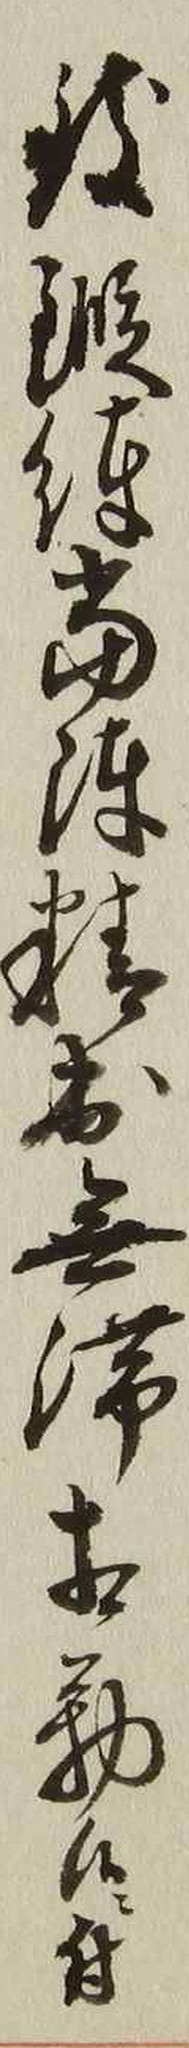致鍛練当陣精出無滞相勤候ニ付
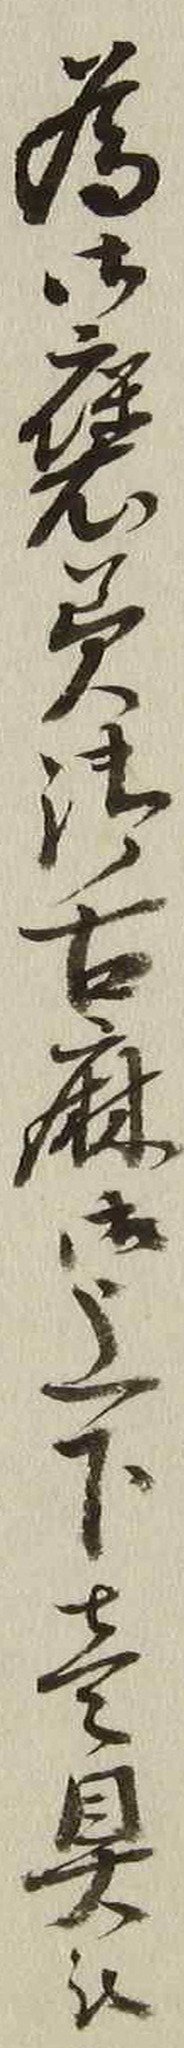為御褒美御古麻御上下壱具被
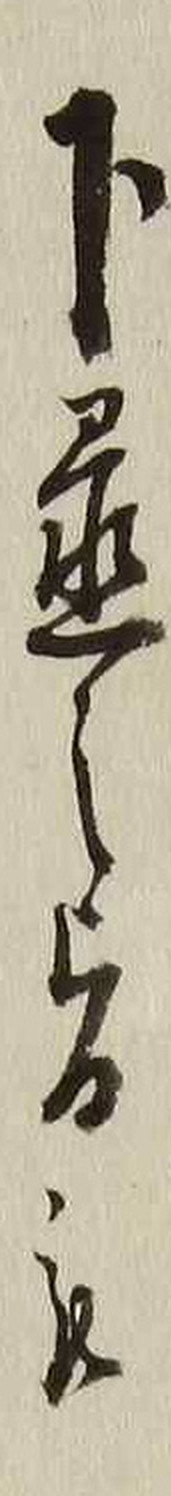下置之旨被仰出候
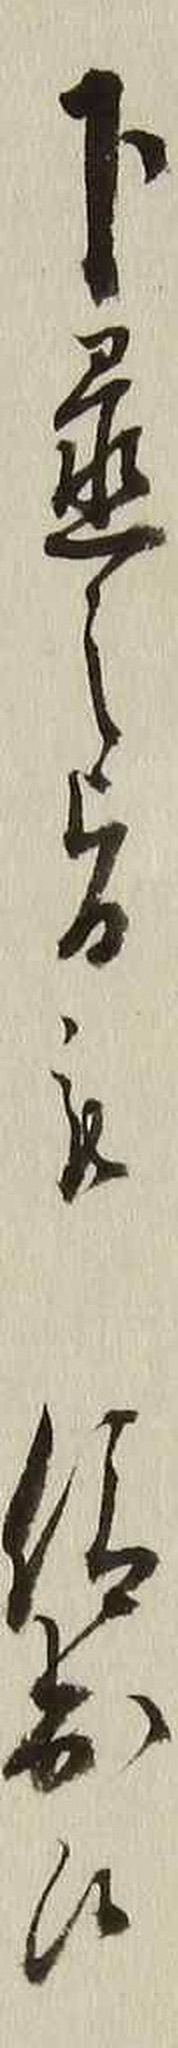下置之旨被仰出候
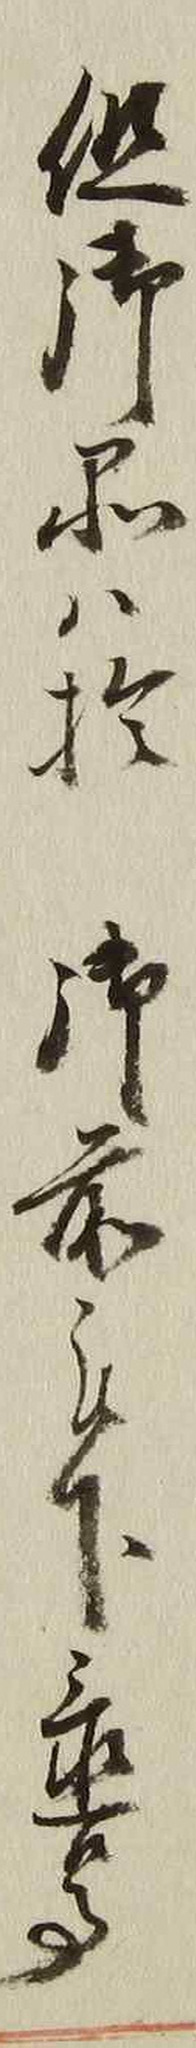但御品ハ於御前被下置候事
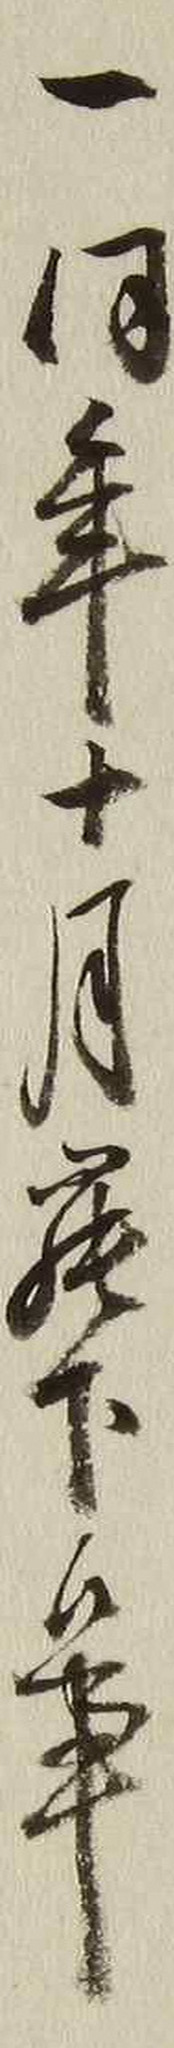一同年十月罷下候事
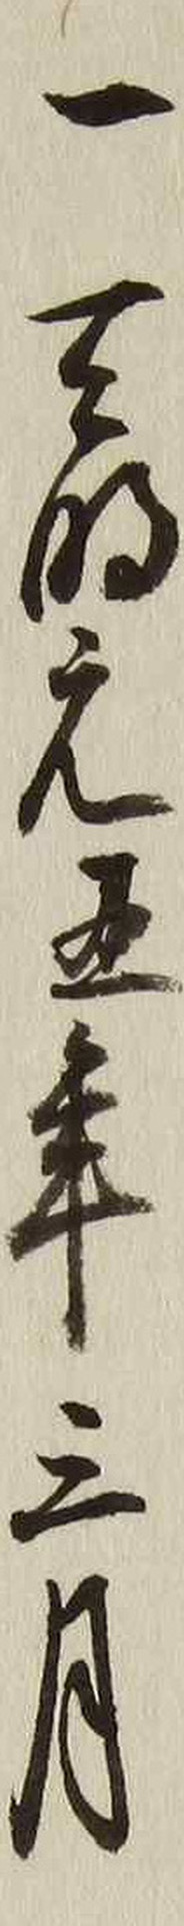一天明元丑年三月
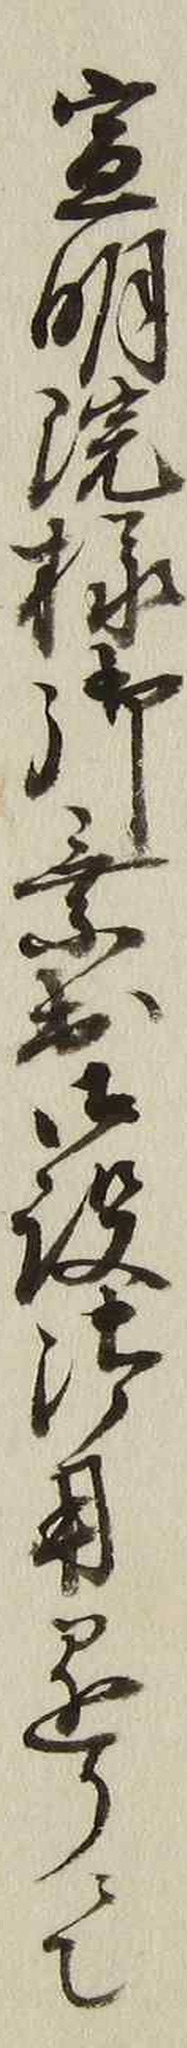宣明院様御乗出御役御用懸りニて
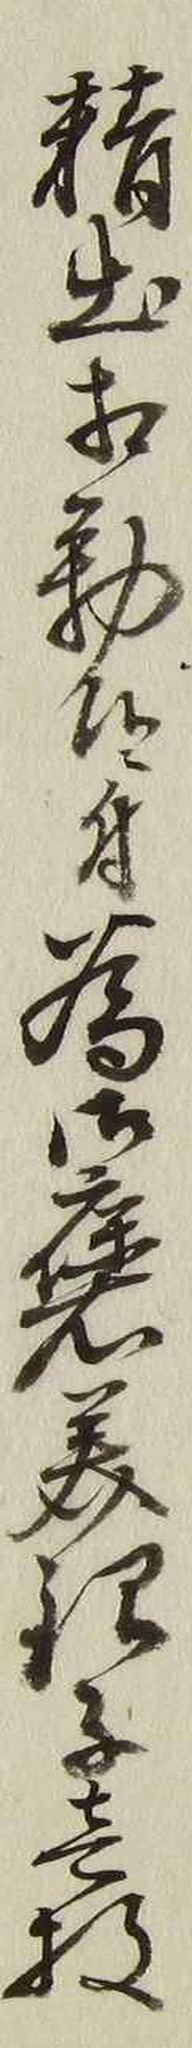精出相勤候ニ付為御褒美銀子壱枚
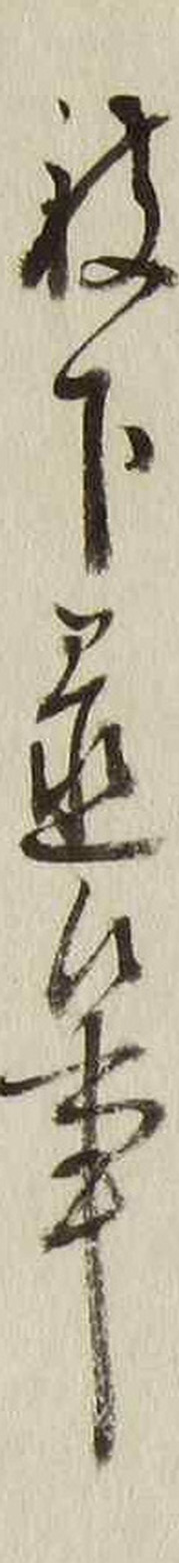被下置候事
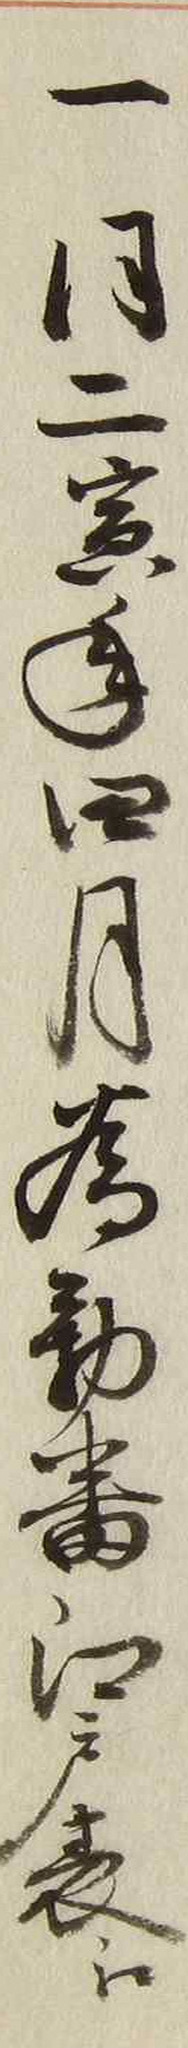一同二寅年四月為勤番江戸表江
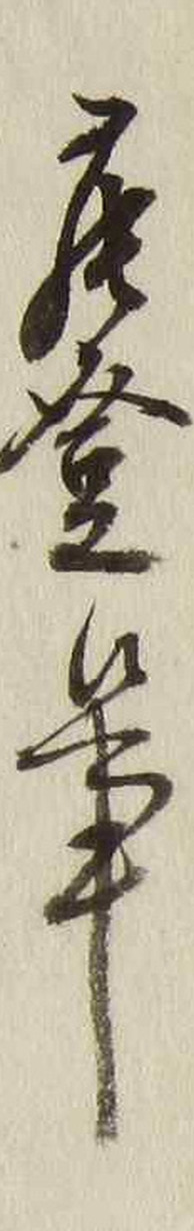罷登候事
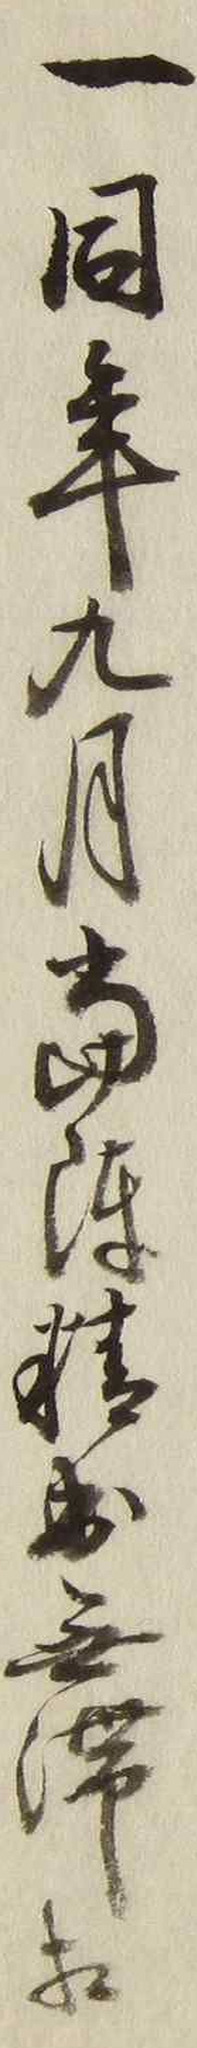一同年九月当陣精出無滞相

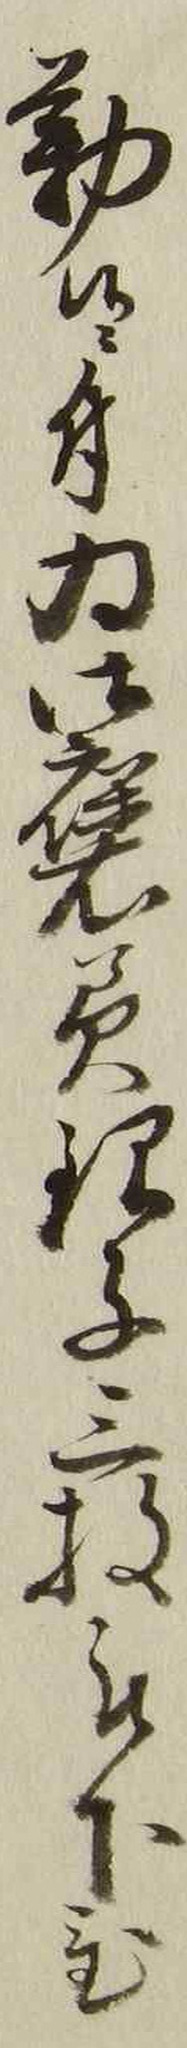勤候ニ付為御褒美銀子三枚被下置
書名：諸士系譜　巻之27　い之部27
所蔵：会津若松市立会津図書館
